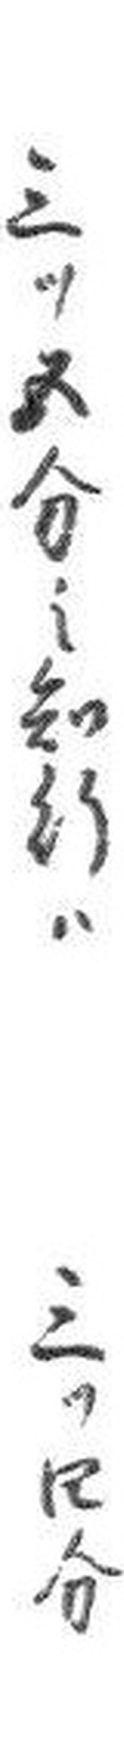三ツ五分之知行ハ三ツ四分
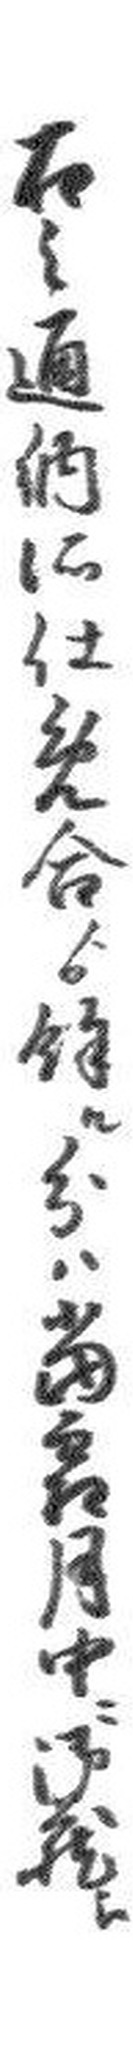右之通納所仕免合ゟ余ル分ハ当霜月中ニ御蔵江
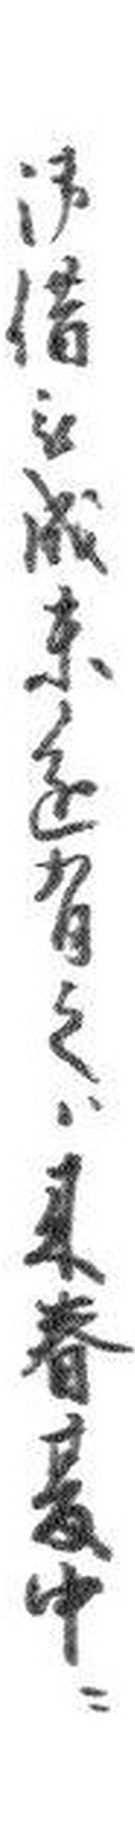御借被成未進有之ハ来春夏中ニ
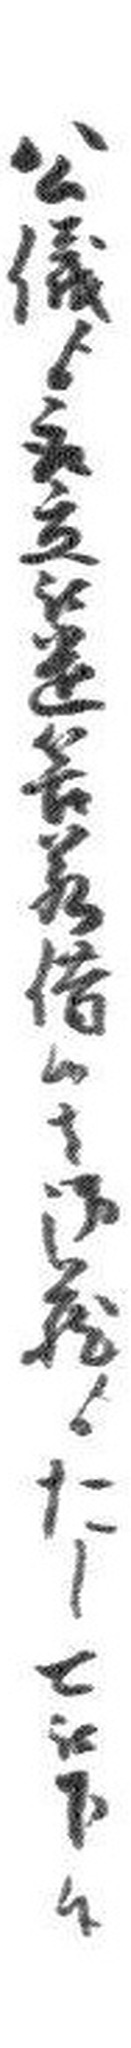公儀ゟ取立被遣筈若借候者御蔵ゟたし可被下候
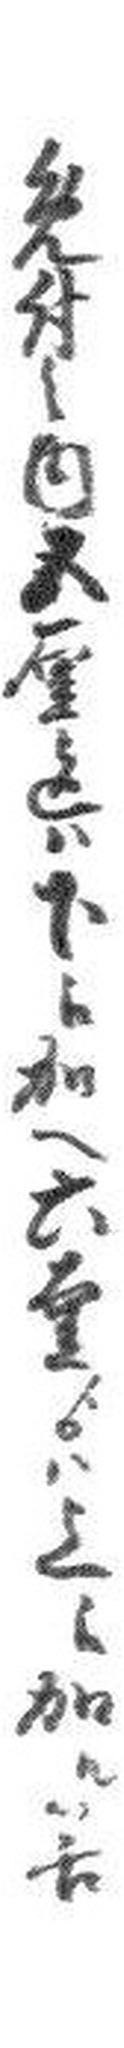免付之内五厘迄ハ下江加ヘ六厘ゟハ上江加ル筈
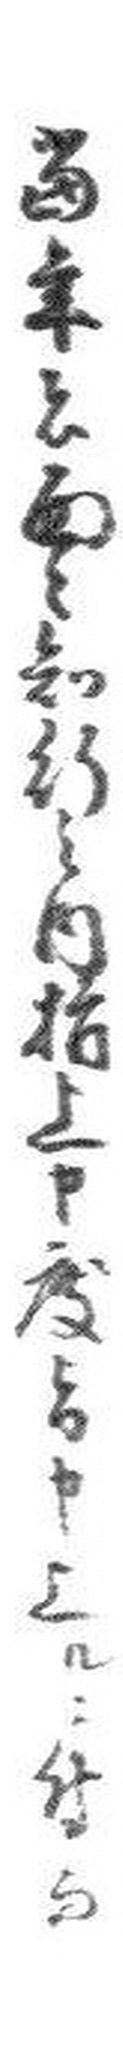当年者面々知行之内指上申度旨申上ルニ付而
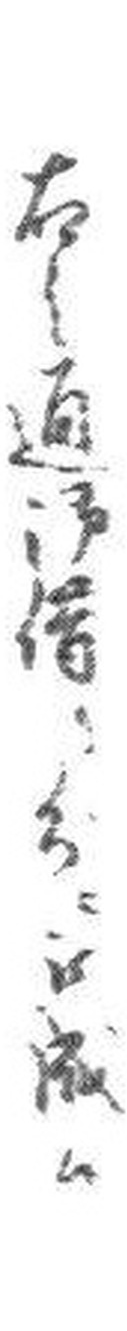右之通御借リ分ニ被成候
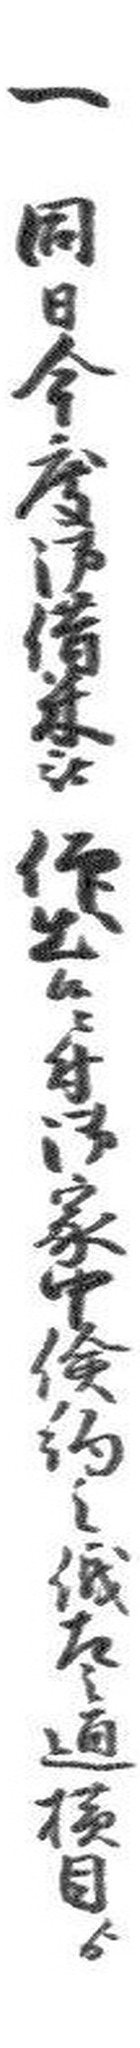一同日今度御借米被仰出候ニ付御家中倹約之儀左之通横目ゟ

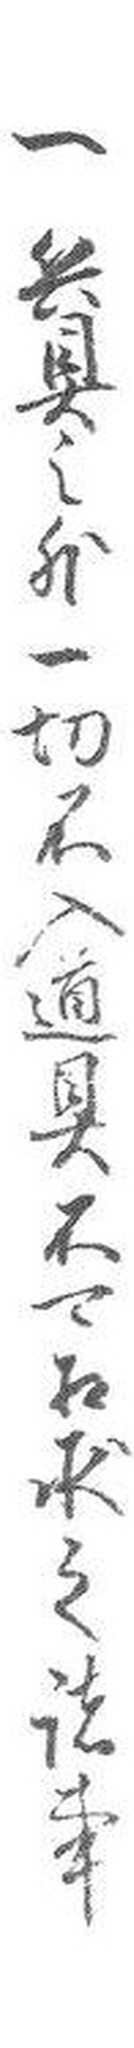一兵具之外一切不入道具不可相求之諸事
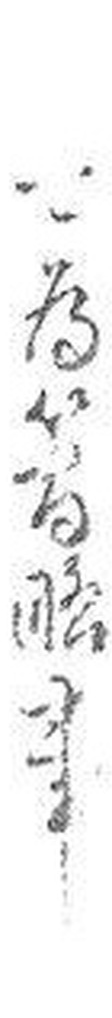可為簡略事
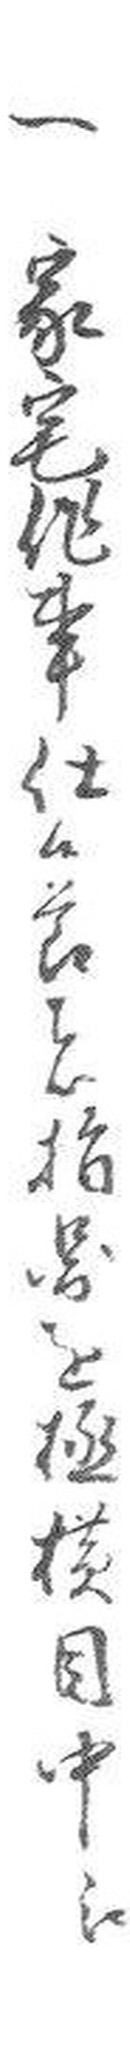一家宅作事仕候節者指図を極横目中江
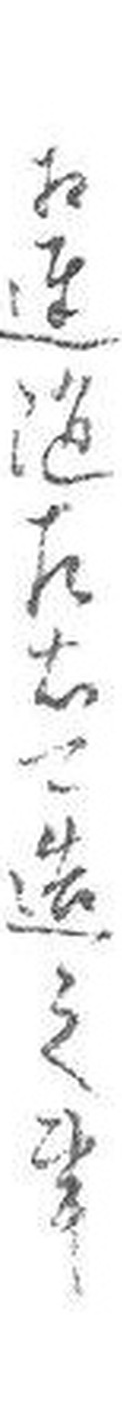相達随左右可造之事
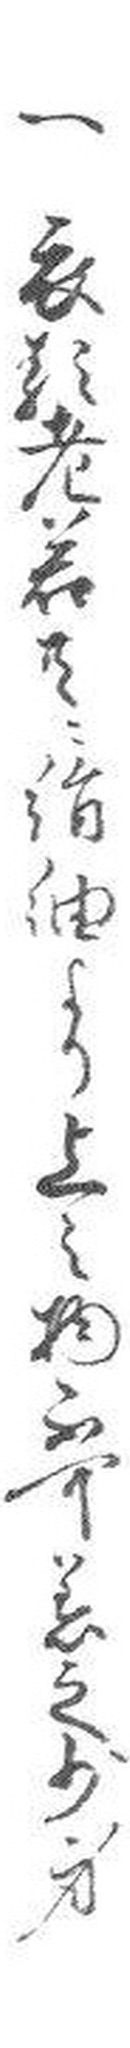一衣類老若共ニ絹紬より上之物不可着之少身
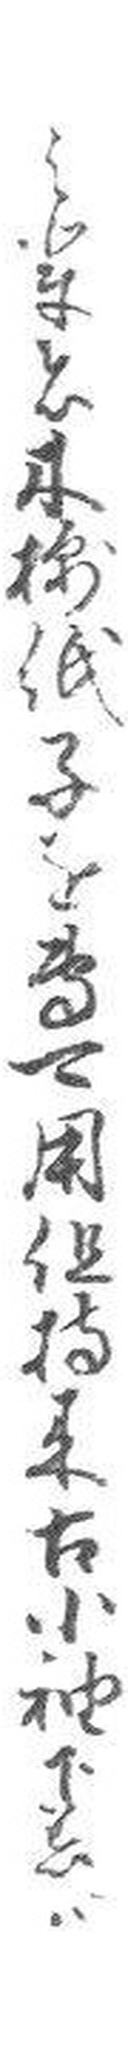之輩者木棉紙子を専可用但持来古小袖下着ハ
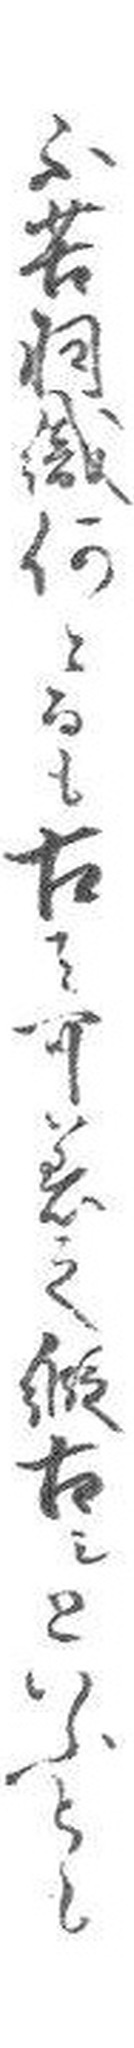不苦羽織何ニ而も古は可着之縦古シといふとも
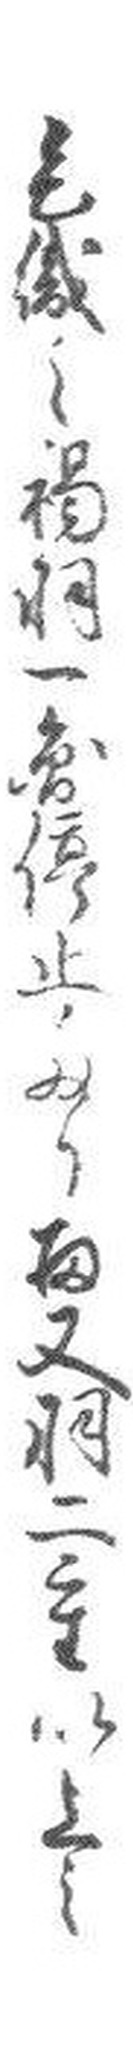毛織之褐羽一円停止たり扨又羽二重以上之
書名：家譜 七 光通公 従寛文四年到同九年
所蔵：福井県文書館 Fukui Prefectural Archives
